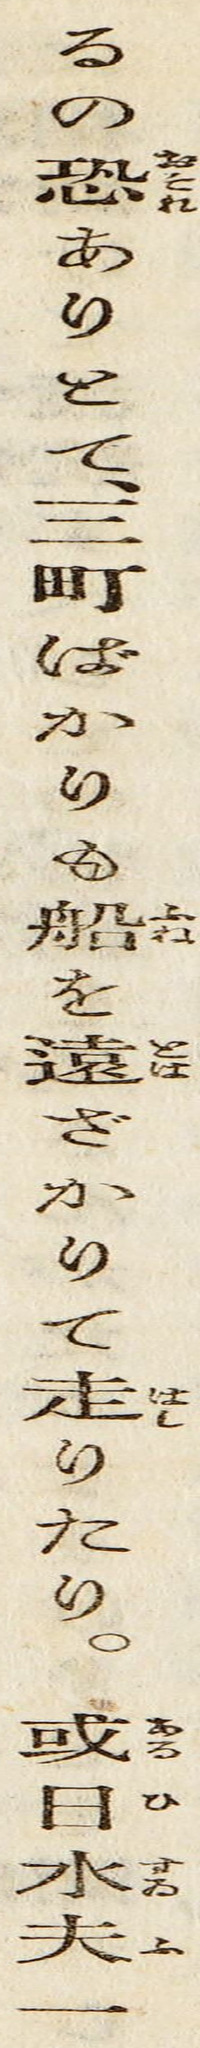るの恐ありとて、三町ばかりも船を遠ざかりて走りたり。或日水夫一
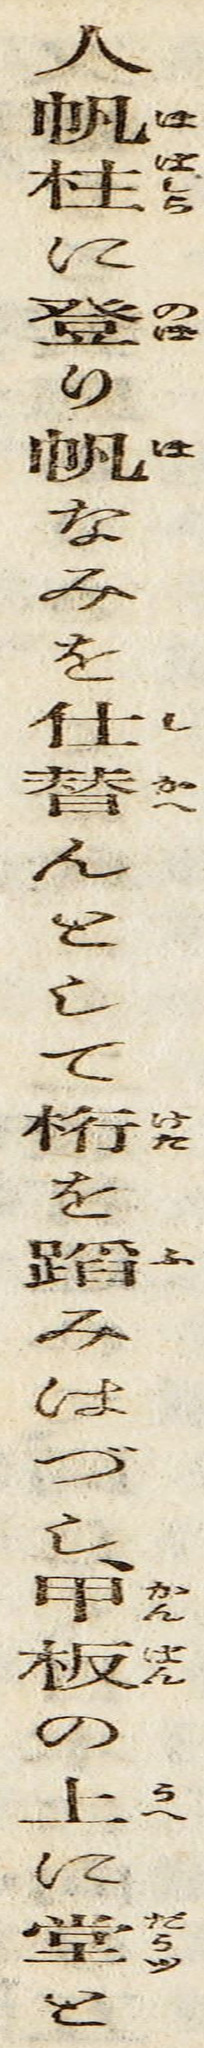人帆柱に登り帆なみを仕替んとして桁を蹈みはづし、甲板の上に堂と
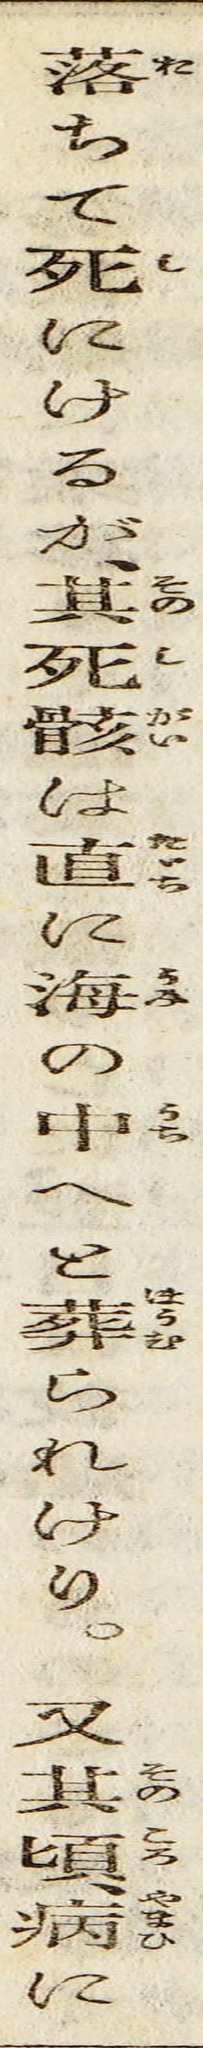落ちて死にけるが、其死骸は直に海の中へと葬られけり。又其頃、病に
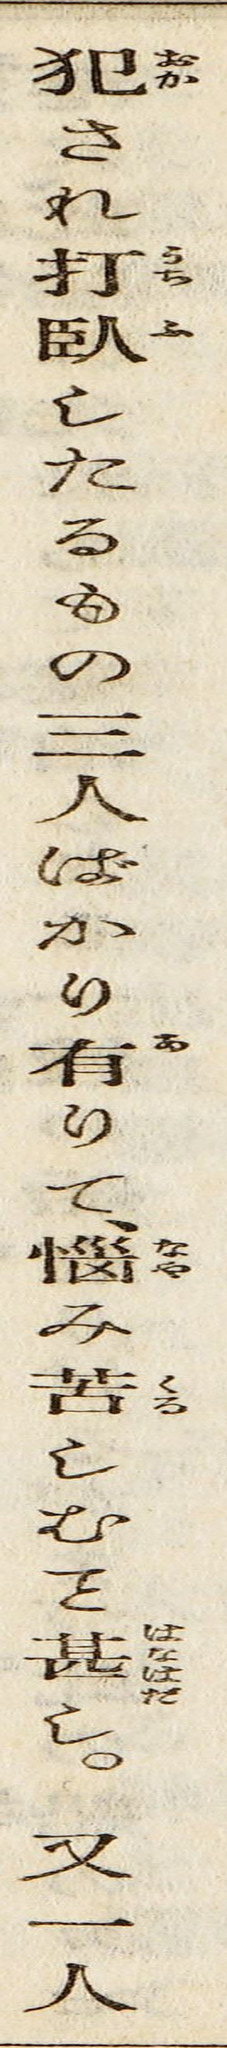犯され打臥したるもの三人ばかり有りて、悩み苦しむこと甚し。又一人
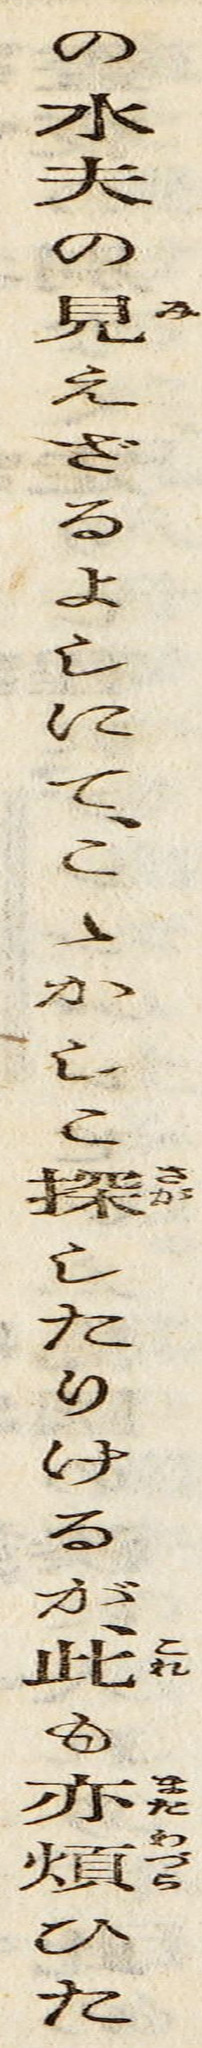の水夫の見えざるよしにて、こゝかしこ探したりけるが、此も亦煩ひた
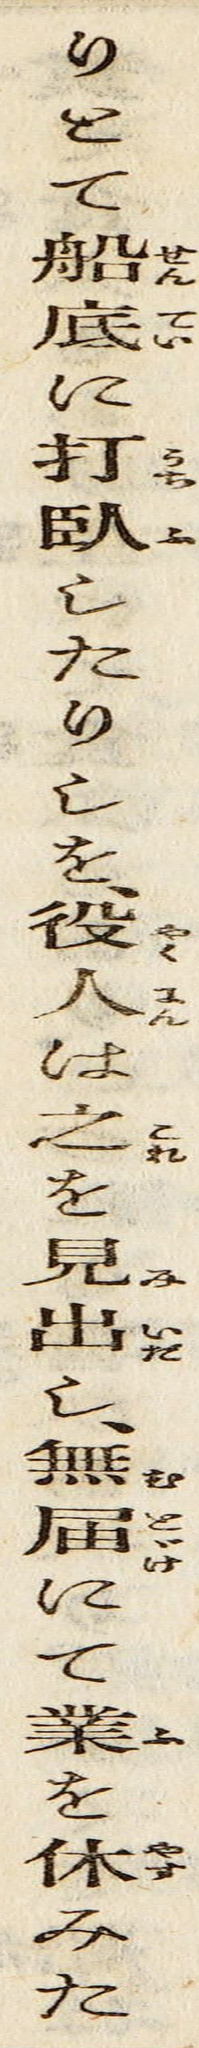りとて船底に打臥したりしを、役人は之を見出し、無届にて業を休みた
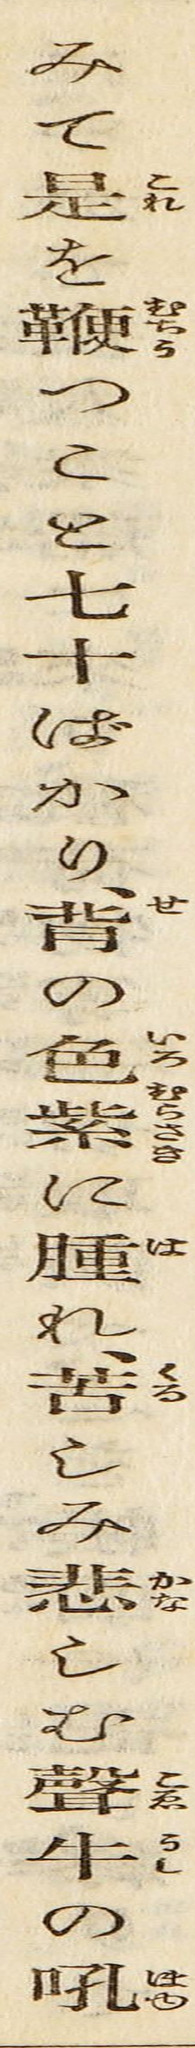みて是を鞭つこと七十ばかり、背の色紫に腫れ、苦しみ悲しむ声牛の吼
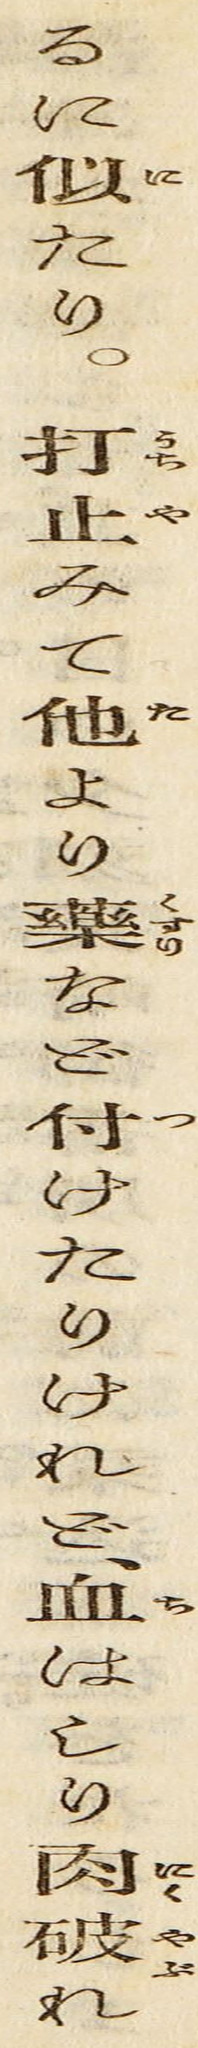るに似たり。打止みて他より薬など付けたりけれど、血はしり肉破れ
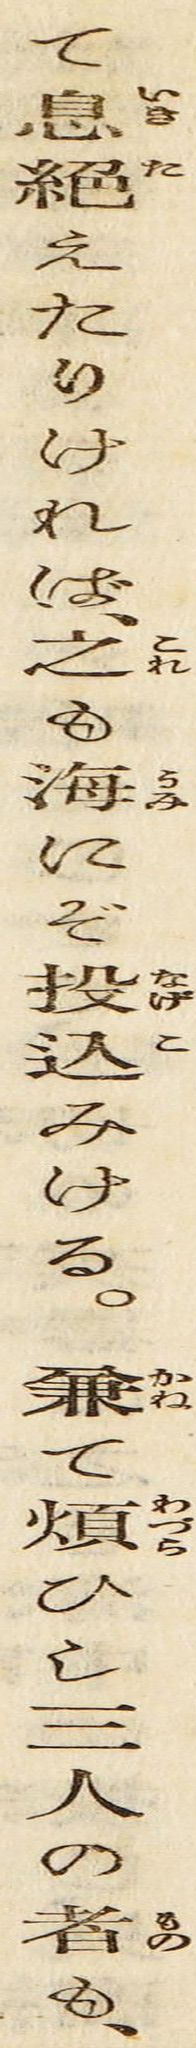て息絶えたりければ、之も海にぞ投込みける。兼て煩ひし三人の者も、
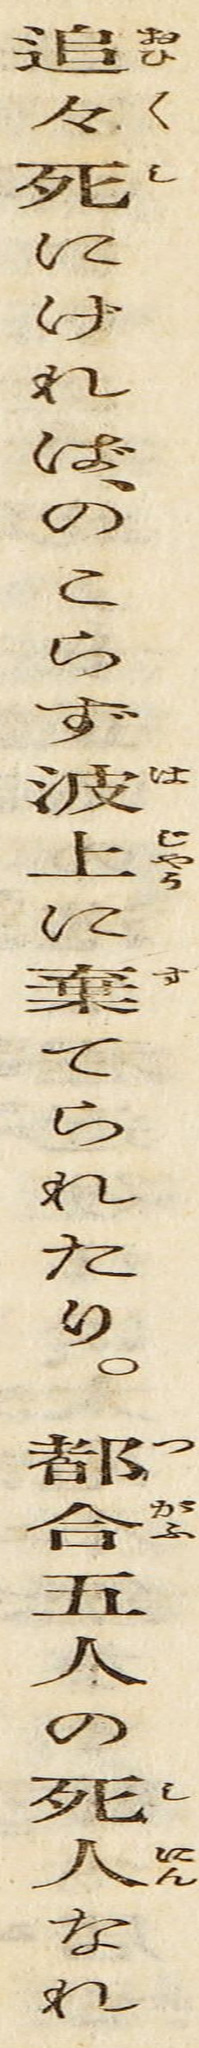追々死にければ、のこらず波上に棄てられたり。都合五人の死人なれ
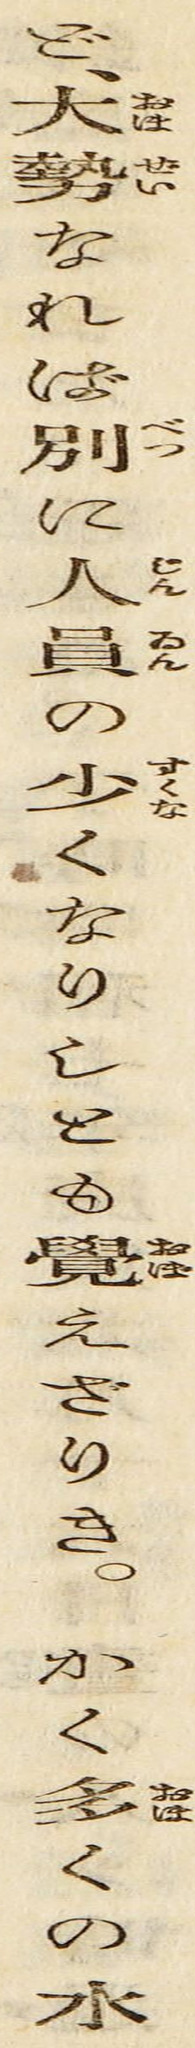ど、大勢なれば別に人員の少くなりしとも覚えざりき。かく多くの水
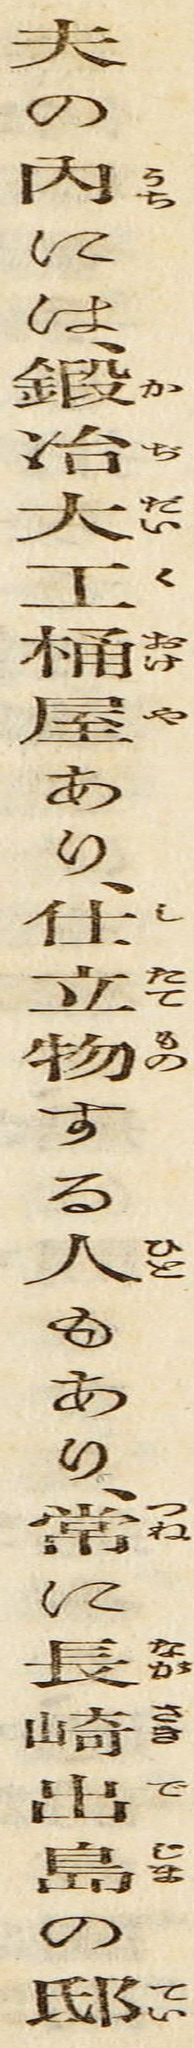夫の内には、鍛冶大工桶屋あり、仕立物する人もあり、常に長崎出島の邸
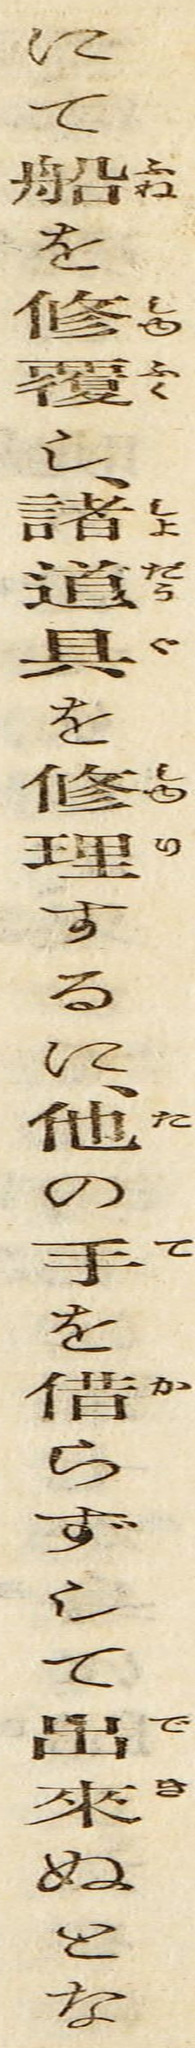にて船を修覆し、諸道具を修理するに、他の手を借らずして出来ぬとな
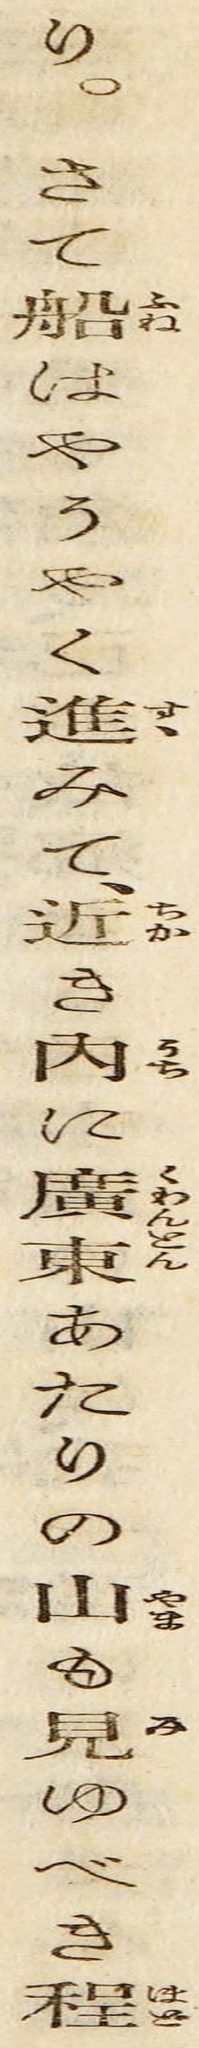り。さて船はやうやく進みて、近き内に広東あたりの山も見ゆべき程
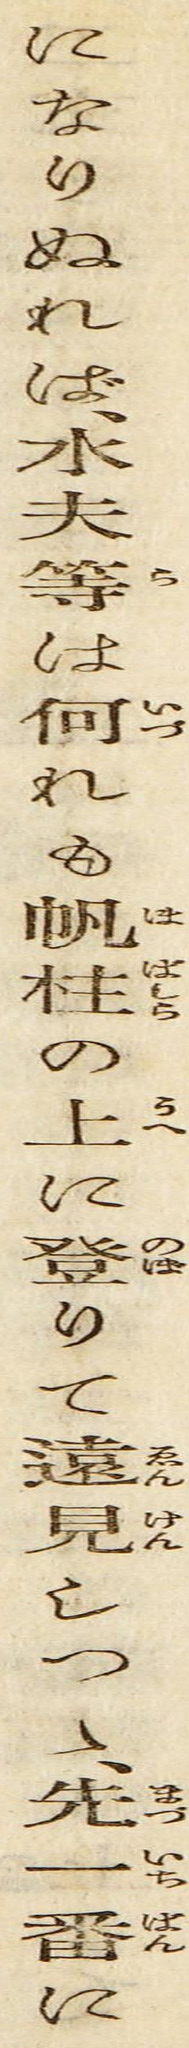になりぬれば、水夫等は何れも帆柱の上に登りて遠見しつゝ、先一番に

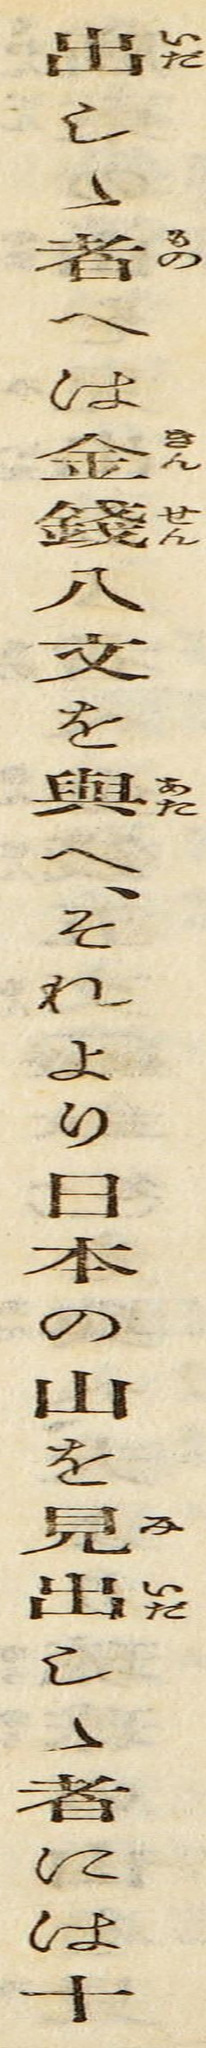出しゝ者へは金銭八文を与へ、それより日本の山を見出しゝ者には十
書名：日本漂流譚
